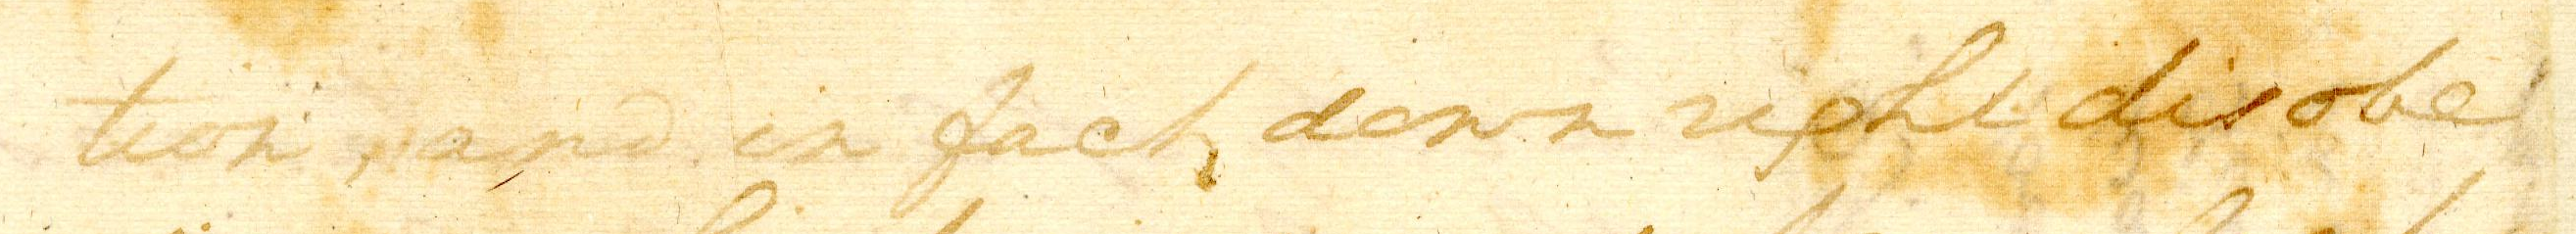tion, and in fact down right disobe
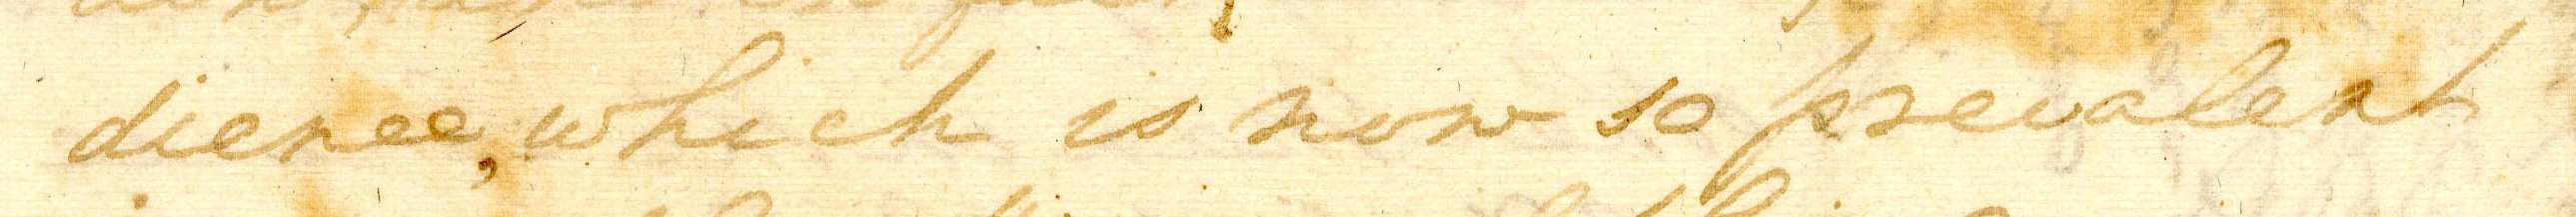dience which is now so prevalent
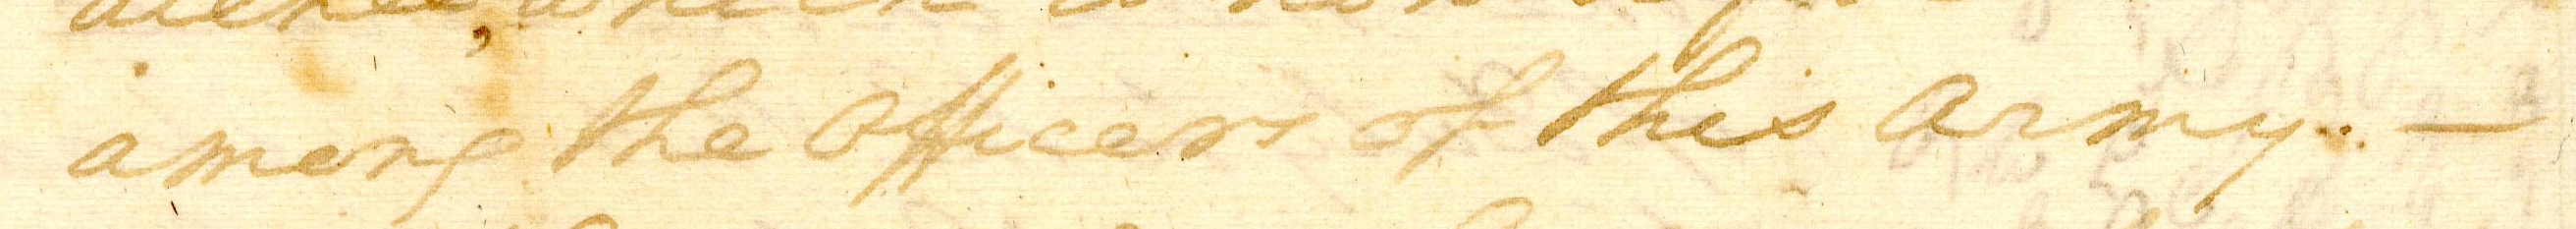among the officers of this army.-
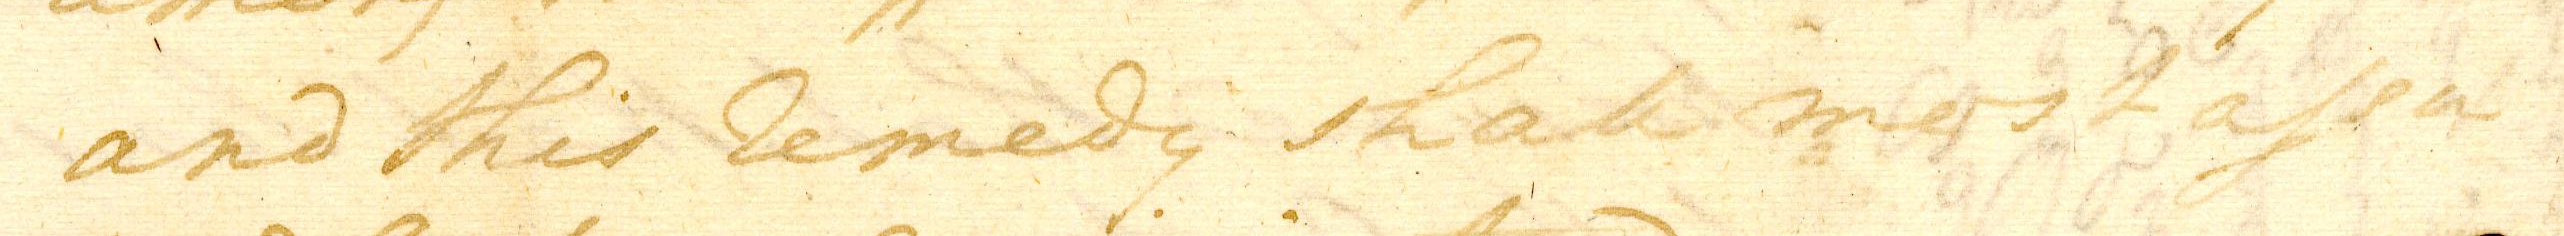and this remedy shall most assu
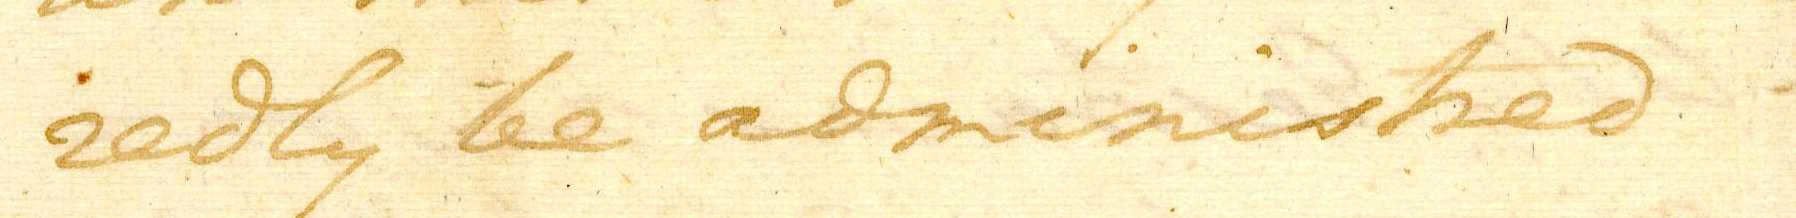redly be administred
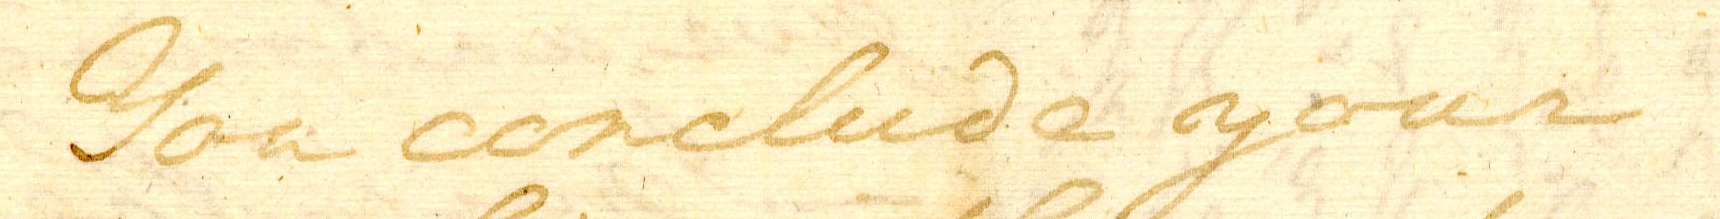You conclude your
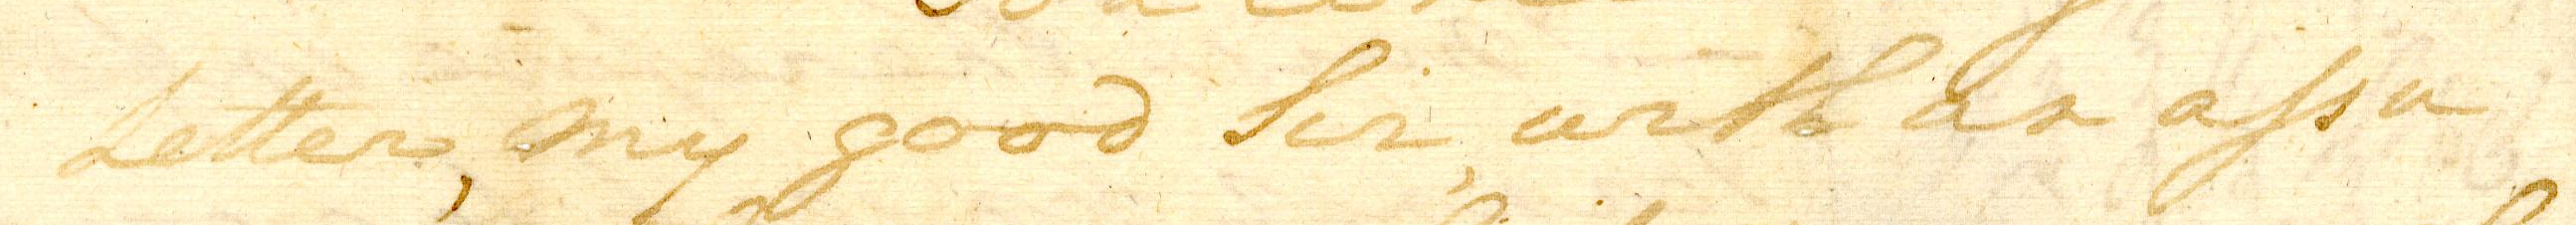Letter, my good Sir, with an assu
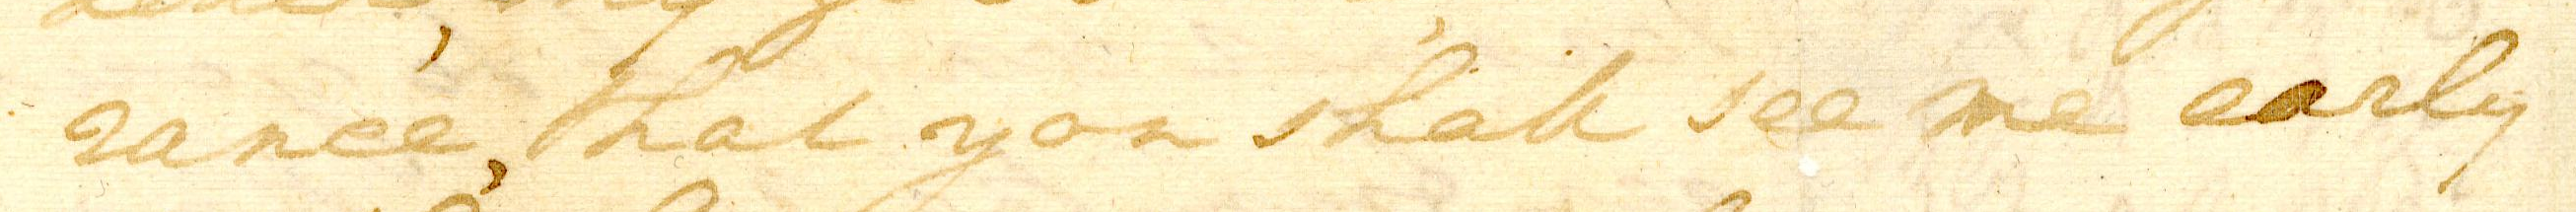rance, that you shall see me early
